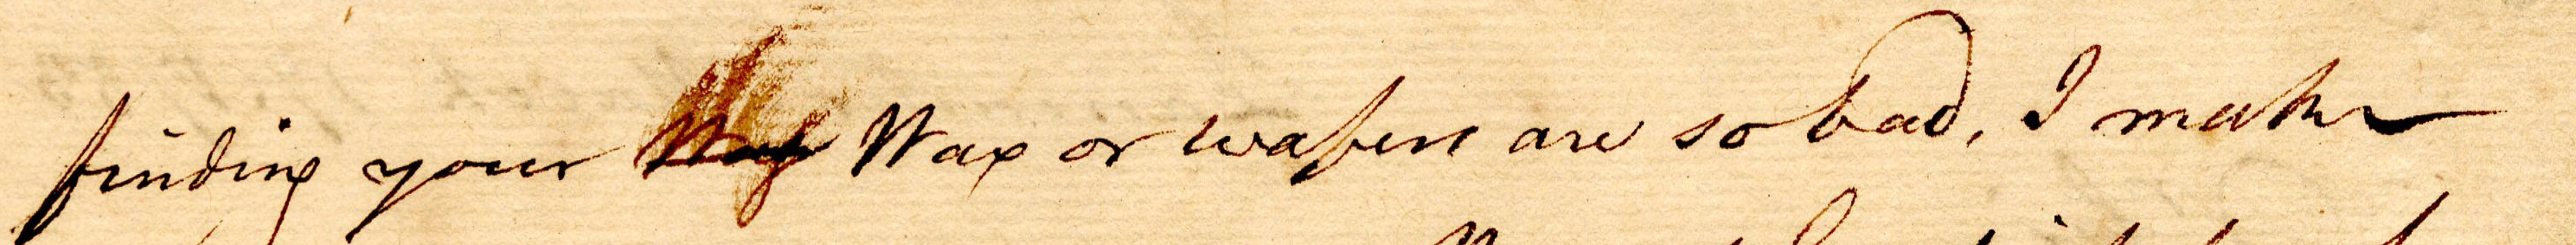finding your way ways or waters are so bad I make
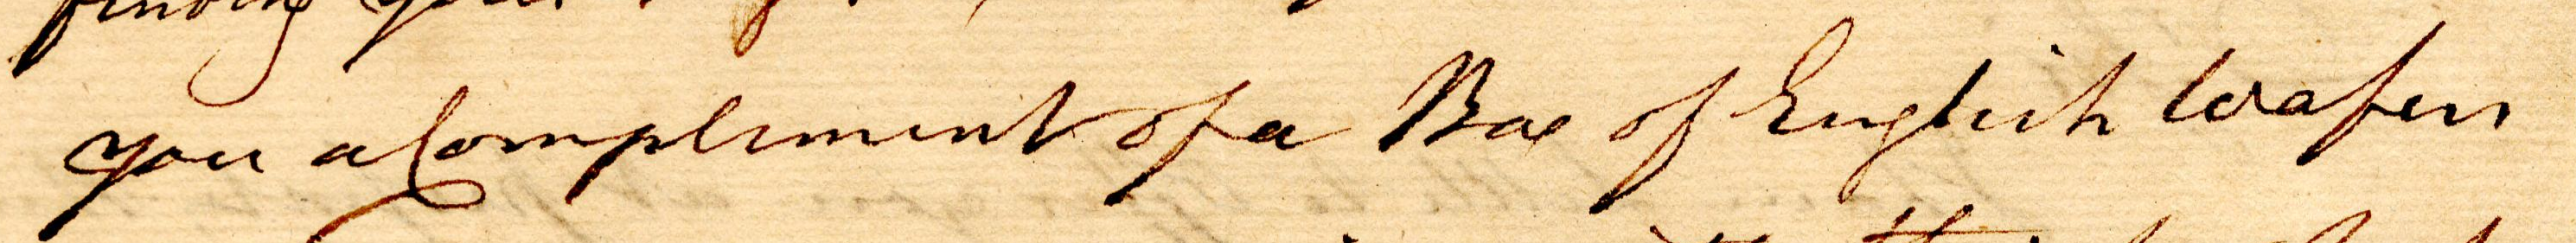you a Compliment of a Box of English loafers
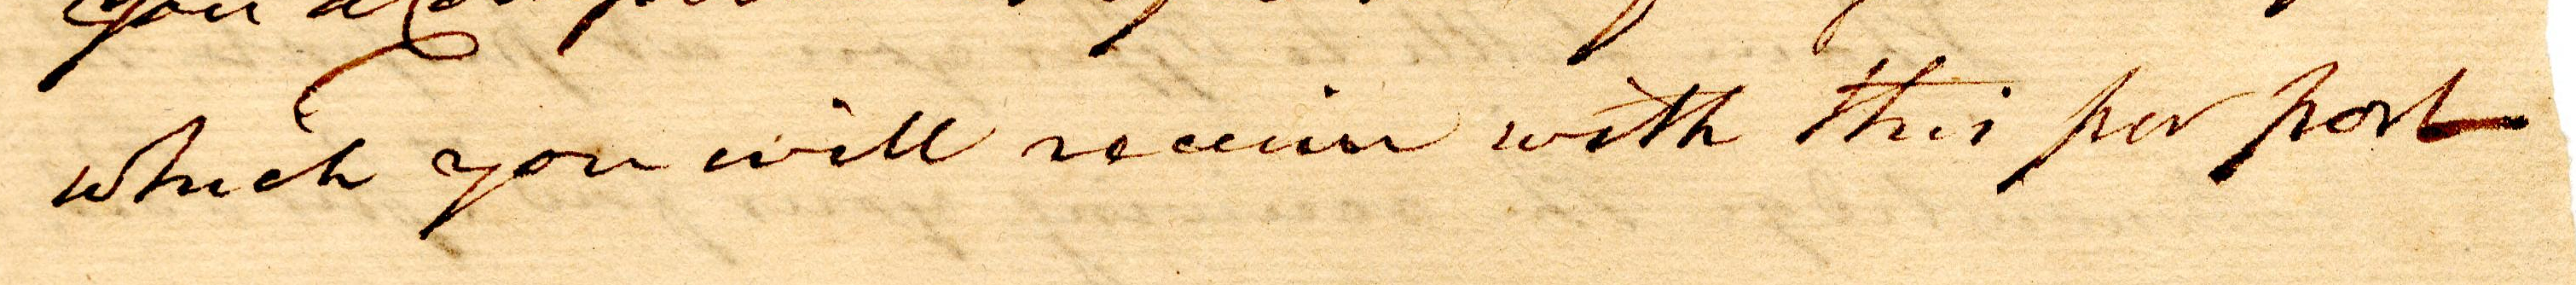which you will receive with this per post
